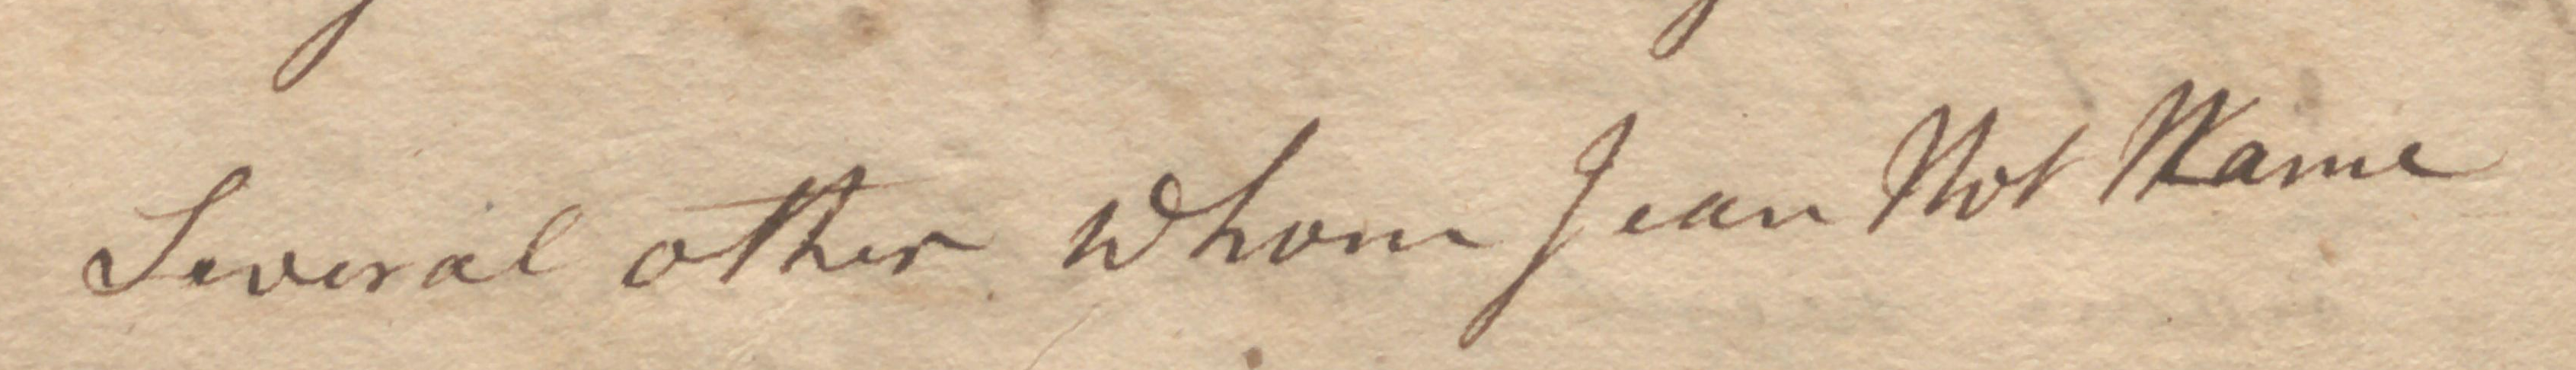Several other whom I can Not Name
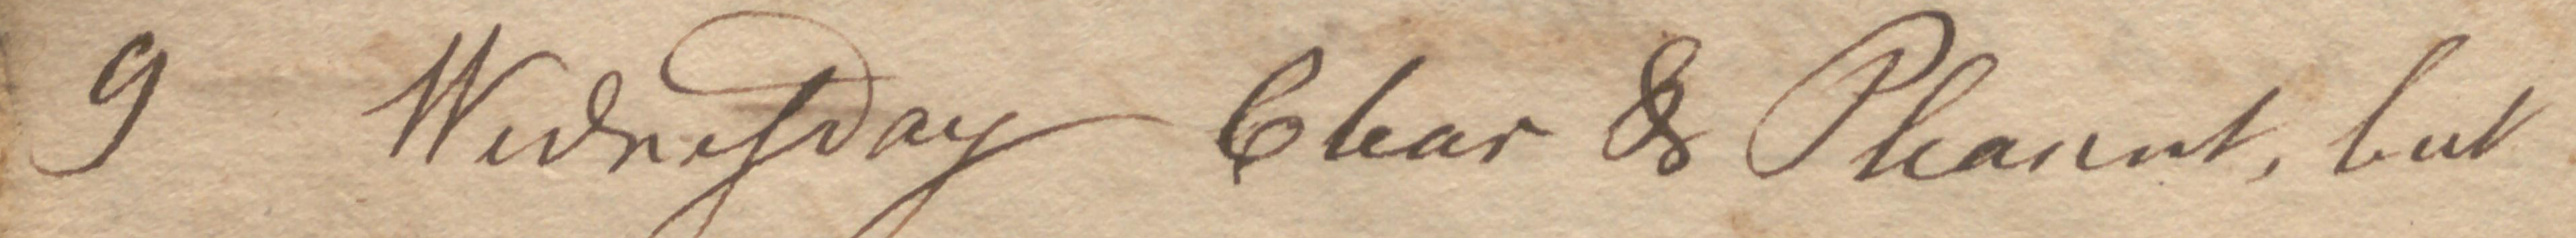9 Wednesday Clear & Pleasent, but
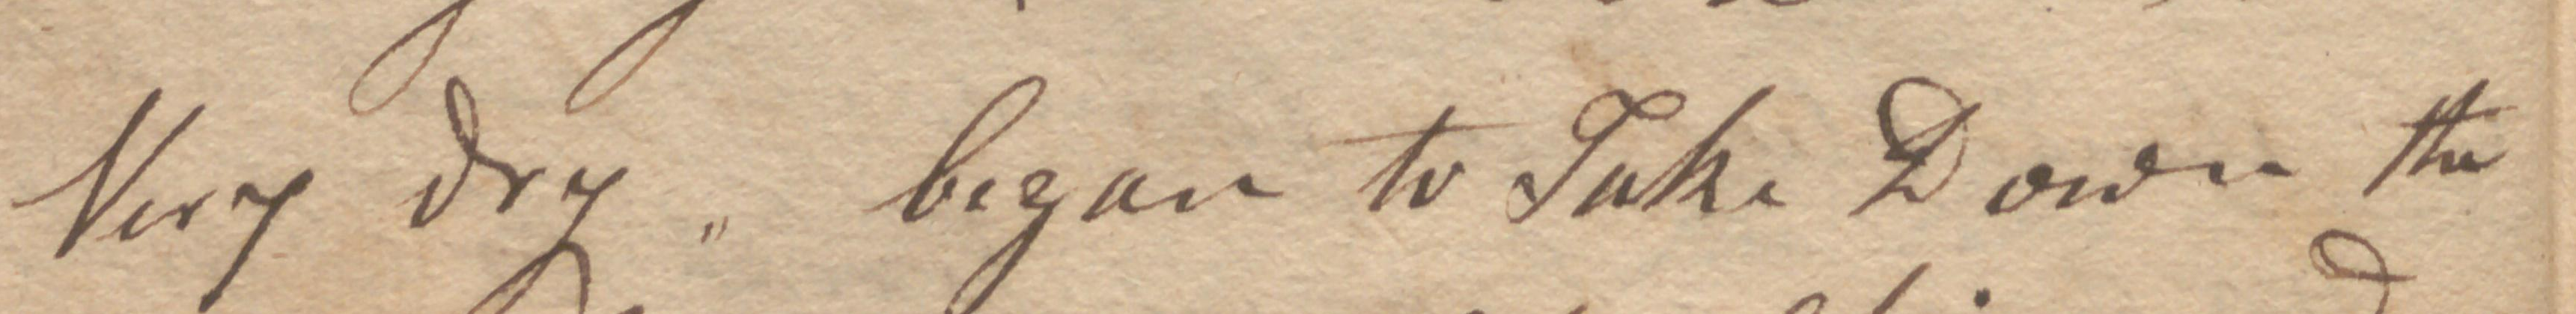Very dry, began to Take Down the
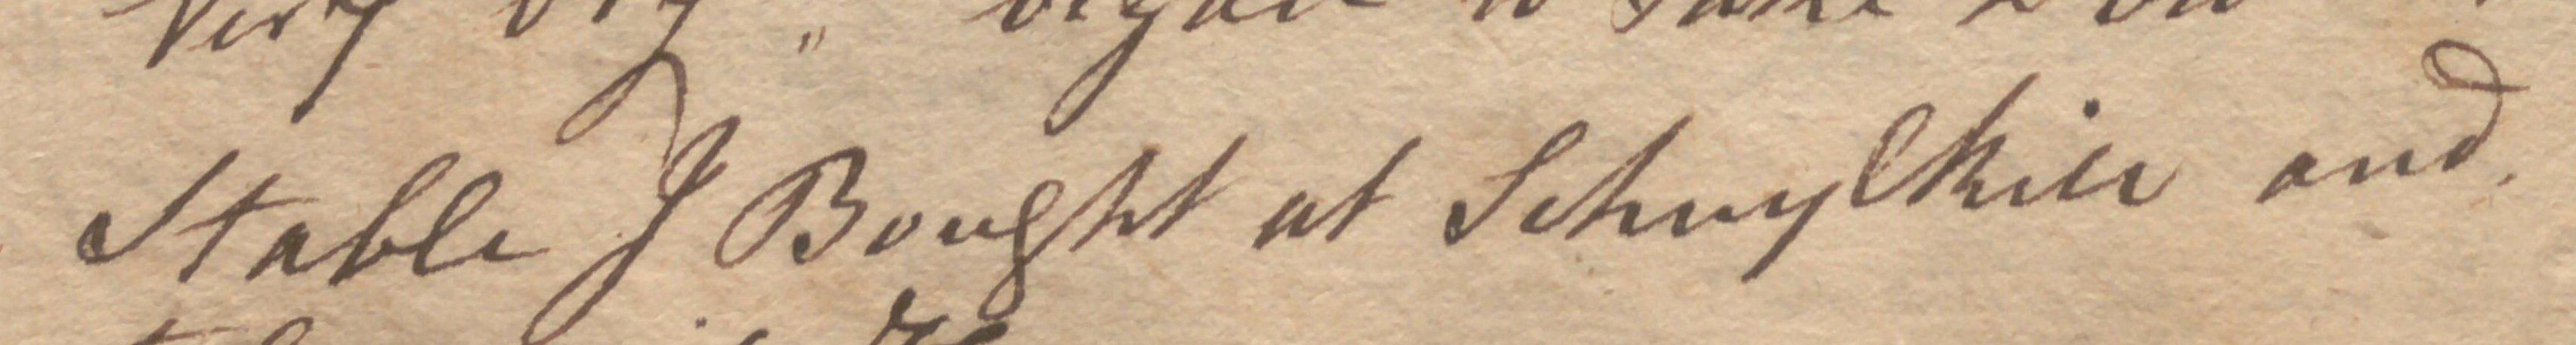Stable I Bought at Schuylkill and
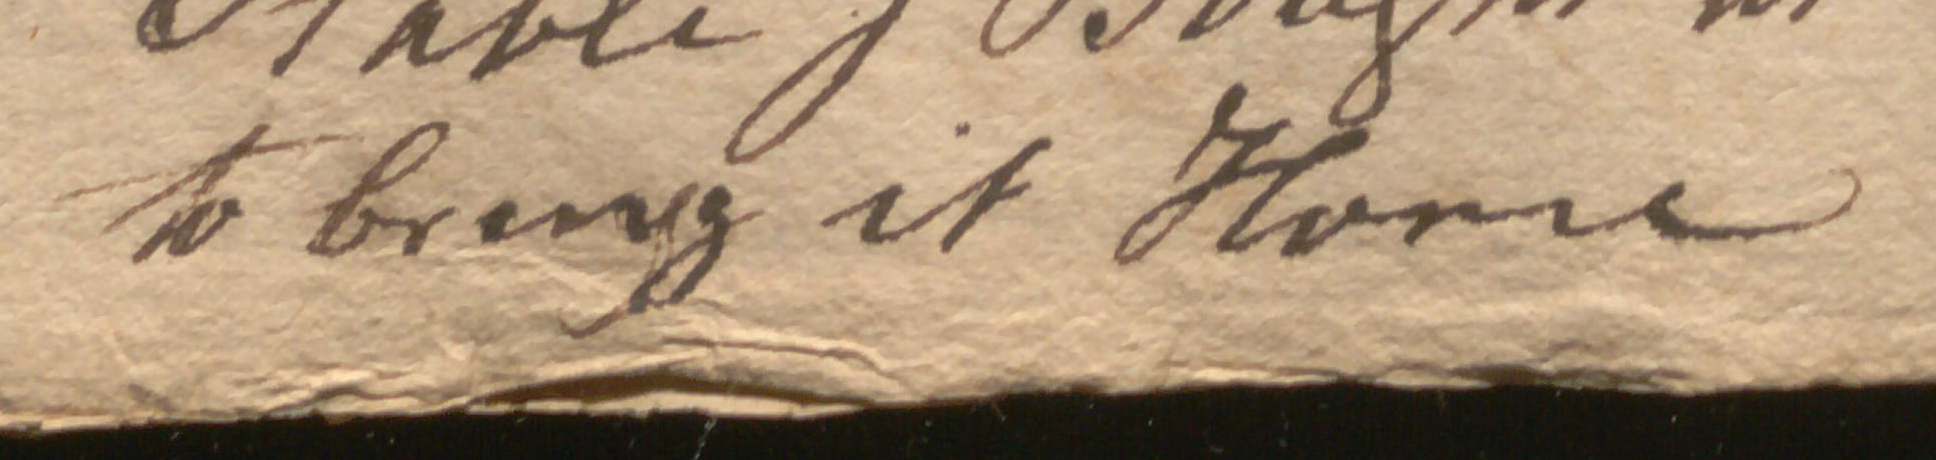to bring it Home
